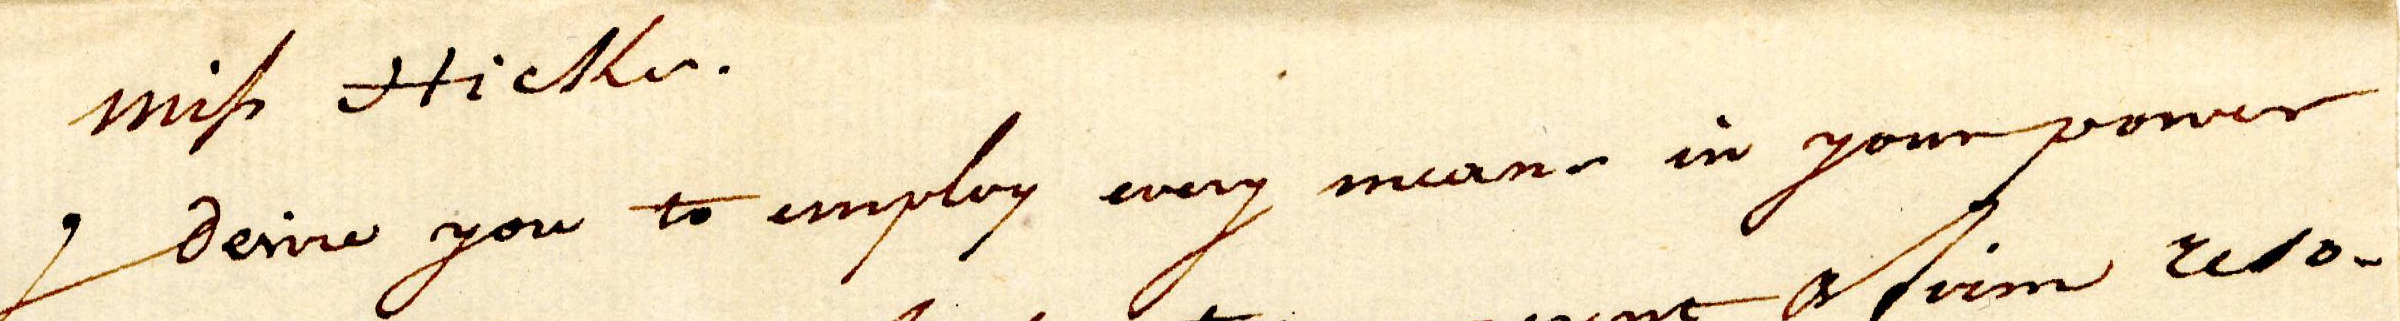I desire you to employ every means in your power
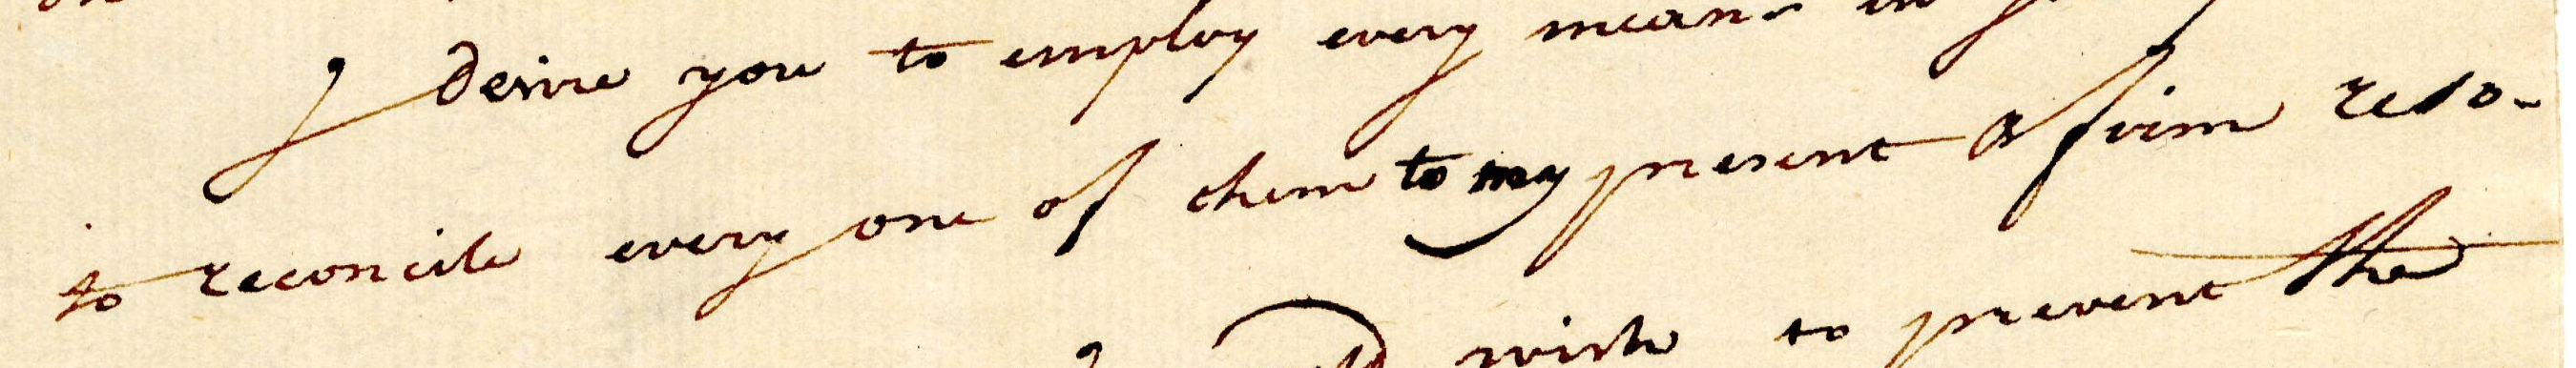to reconcile every one of them to my present & firm reso-
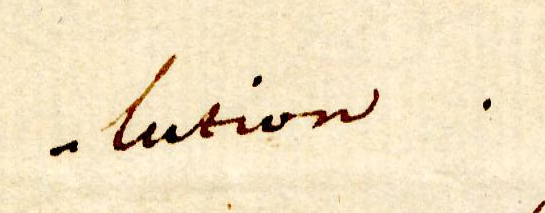-lution.
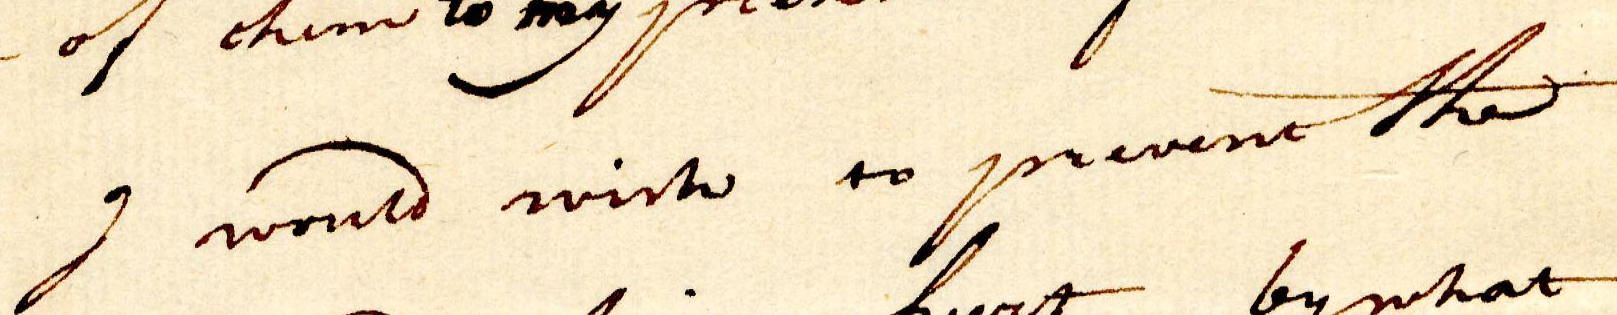I would wish to prevent the
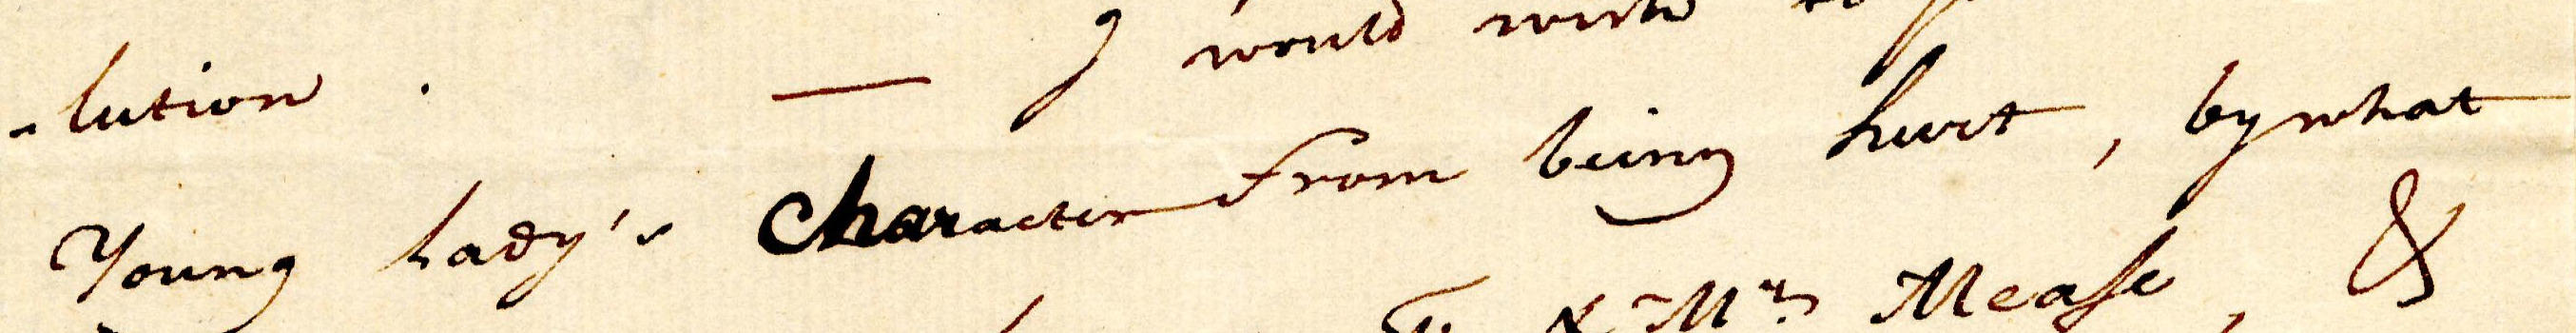Young Lady's Character from being hurt, by what
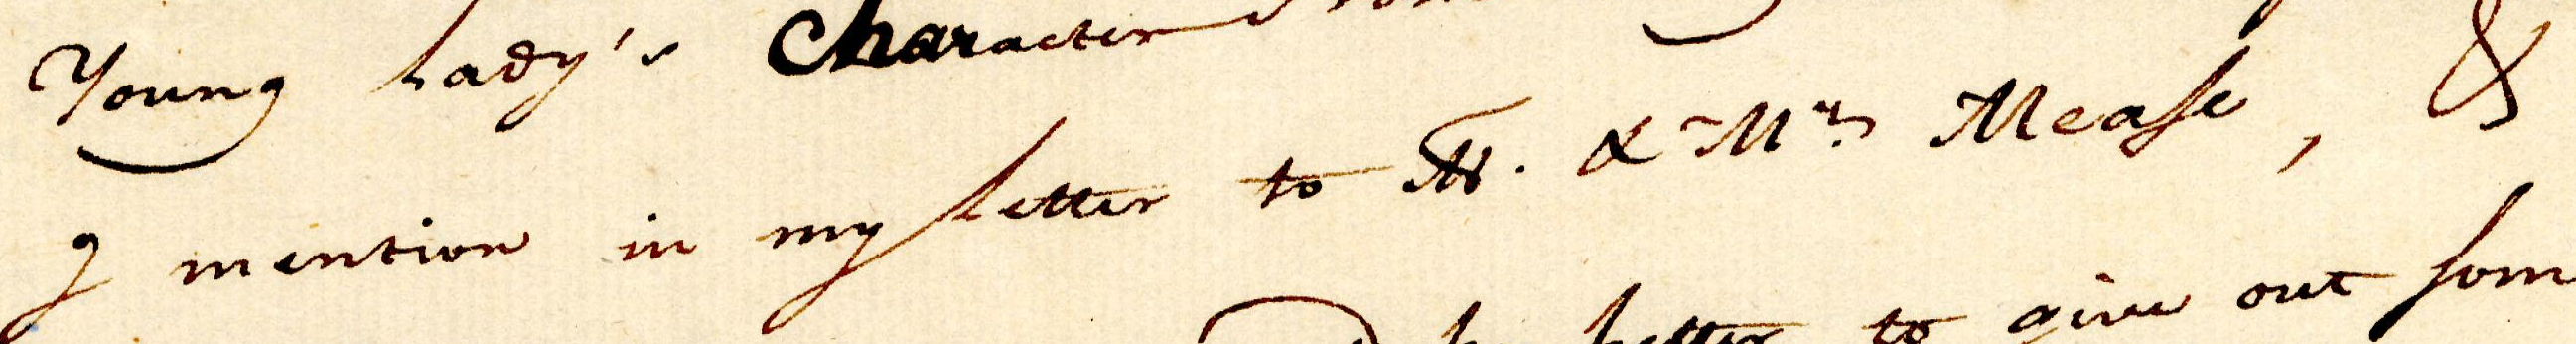I mention in my Letter to M^r. & M^rs. Mease, &
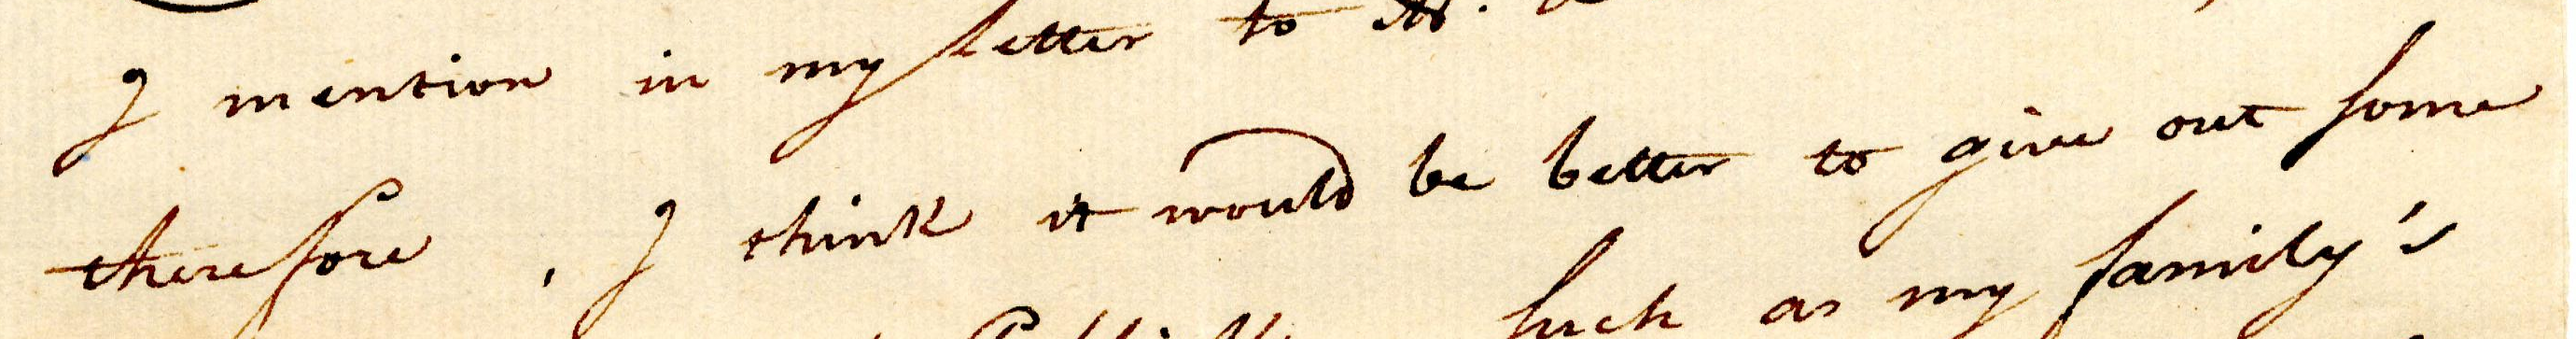therefore, I think it would be better to give out some
